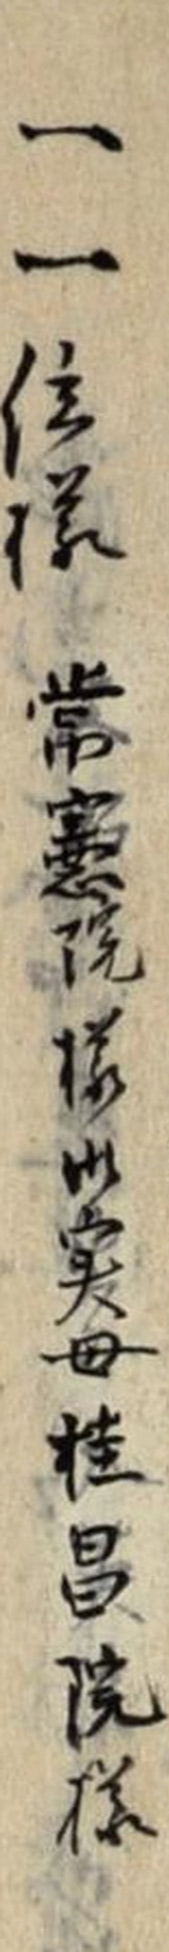一一位様常憲院様御実母桂昌院様
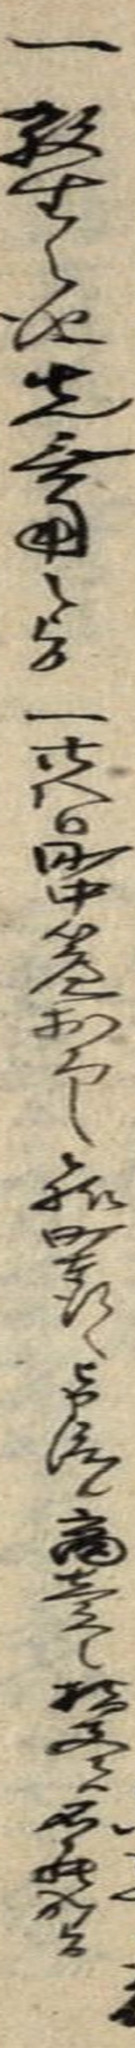一殺生之儀先無用之旨一廿八日町中簾おろし候様町奉行へ被申渡候商売之指支には不罷成旨
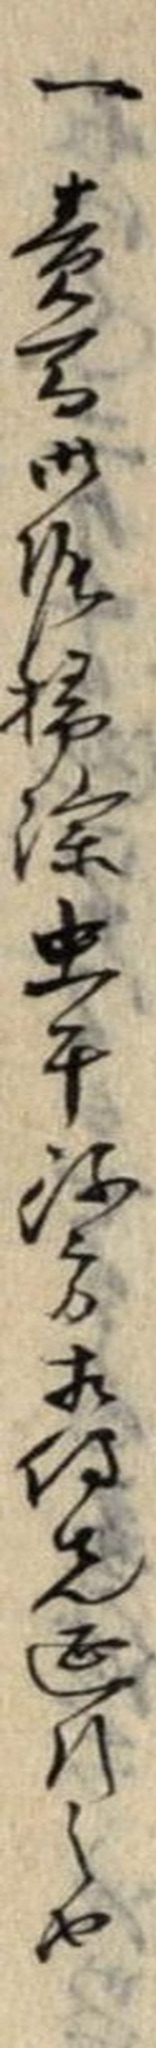一責馬御堀掃除虫干致方相待先延引之由
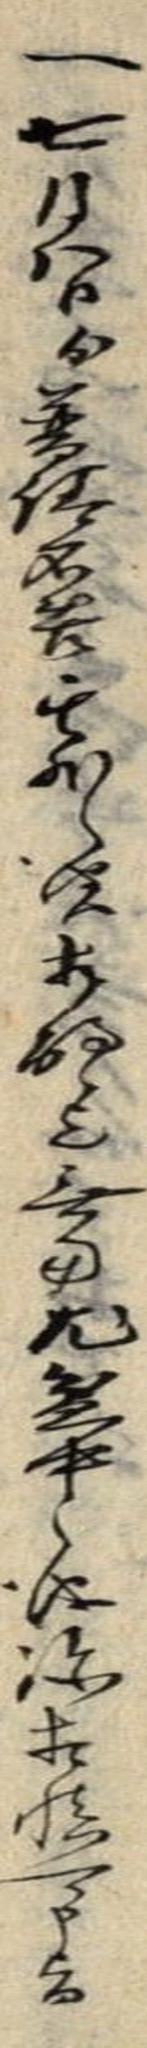一七月八日ゟ普請不苦其外之儀は相触候迄無用尤盆中之儀弥相慎可申旨
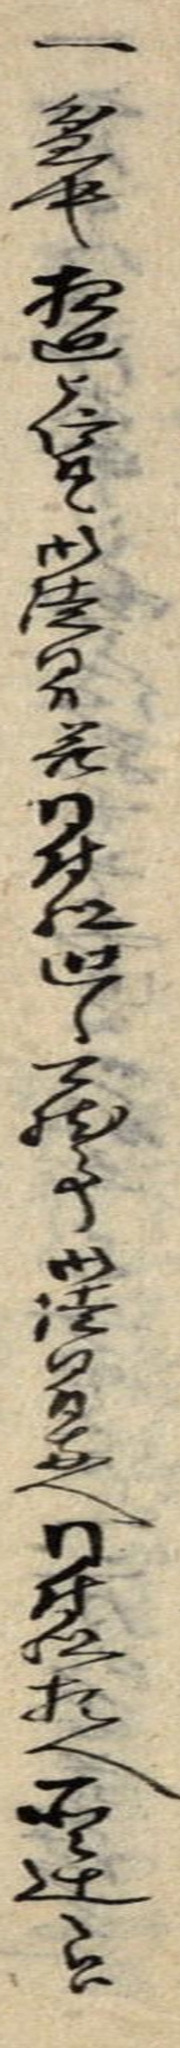一盆中夜廻被仰付候御徒目付并目付組廻し可然事御徒目付両人目付組拾人所々辻々えは
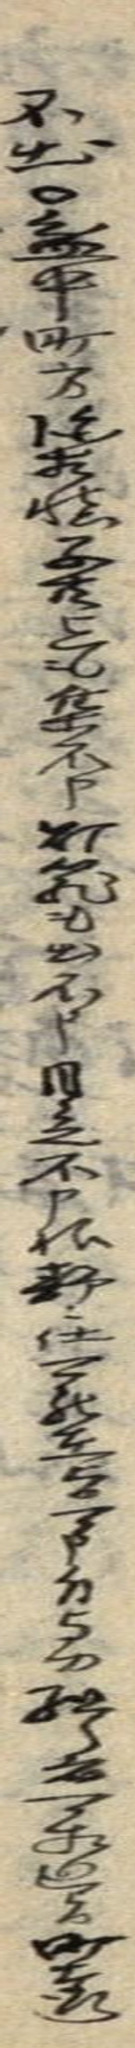不出◦盆中町方弥相慎子共迄も集不申灯籠も出不申目立不申様静に仕可罷在旨可申付与力組之者可相廻旨町奉行へ被申渡候
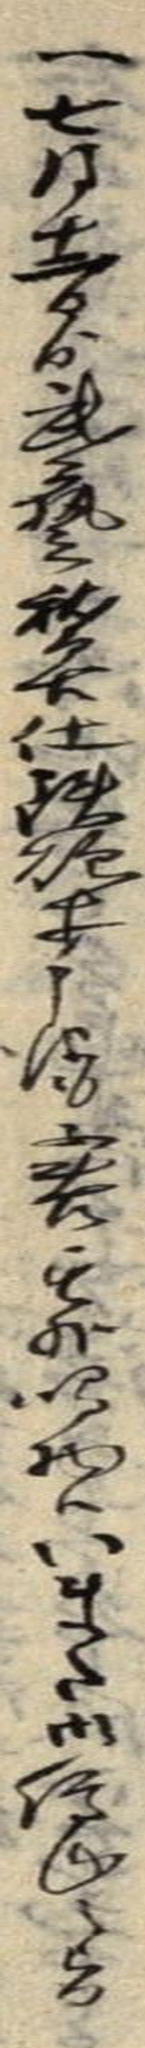一七月十二日ゟ武芸稽古仕鉄炮打申儀も不苦其外鳴物はいまた御停止之旨
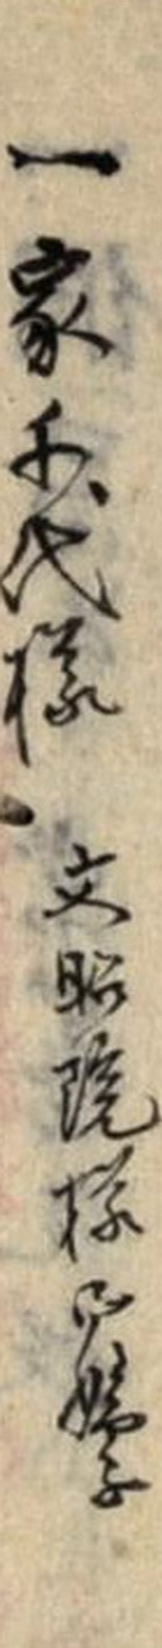一家千代様文昭院様御嫡子

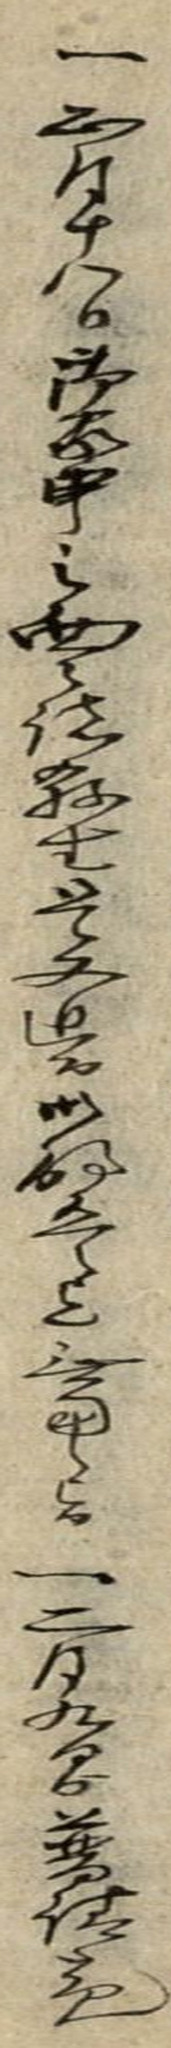一正月十八日御家中之面々諸殺生是又追て御触有之迄無用之旨一二月九日ゟ普請御免
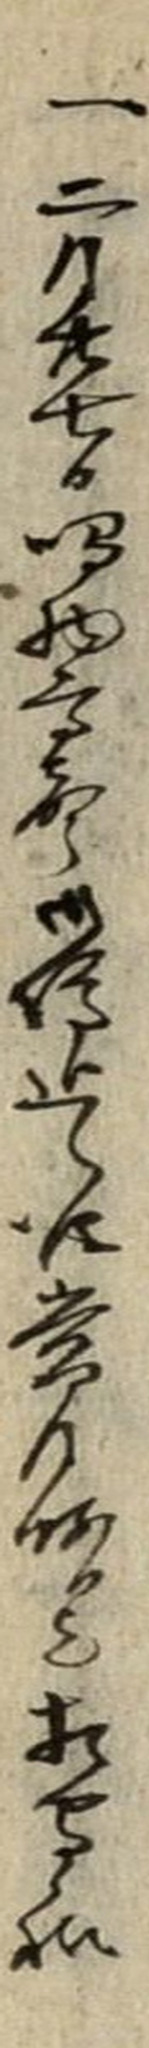一二月廿七日鳴物高声御停止之儀当月晦日迄相守候様
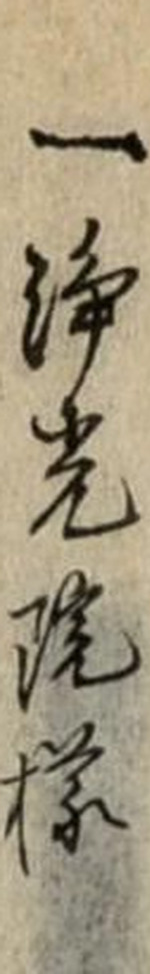一浄光院様
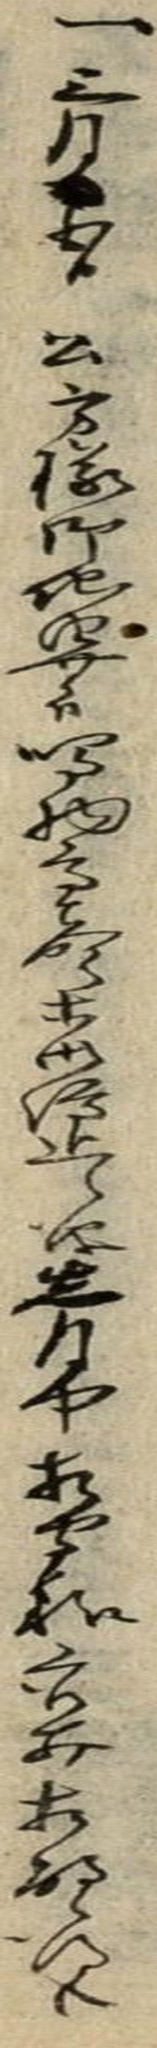一三月五日公方様御他界に付鳴物高声等御停止之儀先月中相守候様最前相触候得共
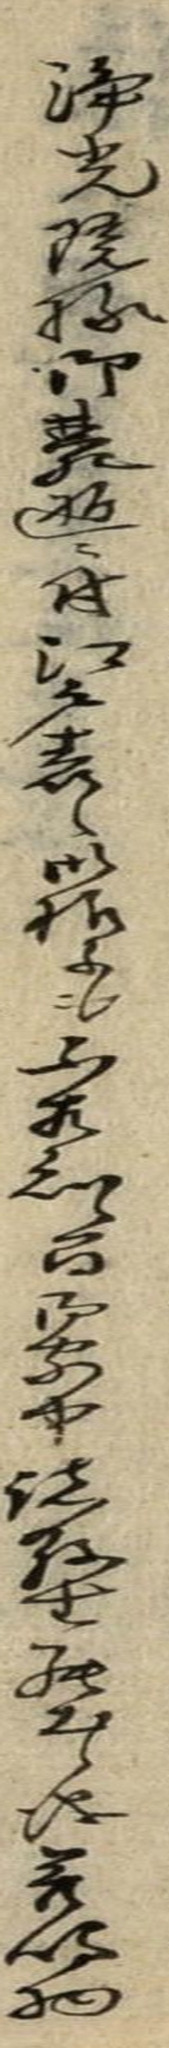浄光院様御薨逝に付江戸表之御様子も不相知候間御家中諸殺生罷出候儀并鳴物
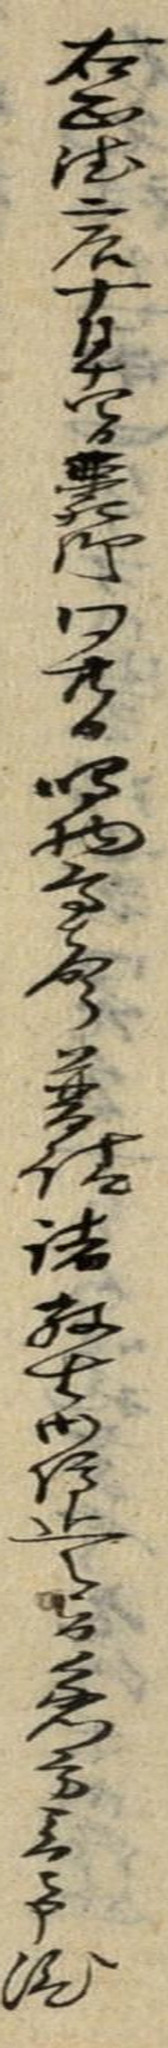右正徳二辰十月十四日薨御同廿日鳴物高声普請諸殺生御停止之旨多門方にて被申渡
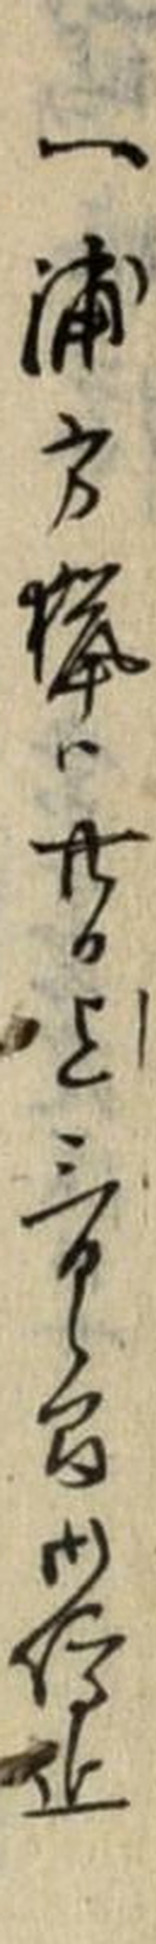一浦方猟は廿日迄三日之間御停止
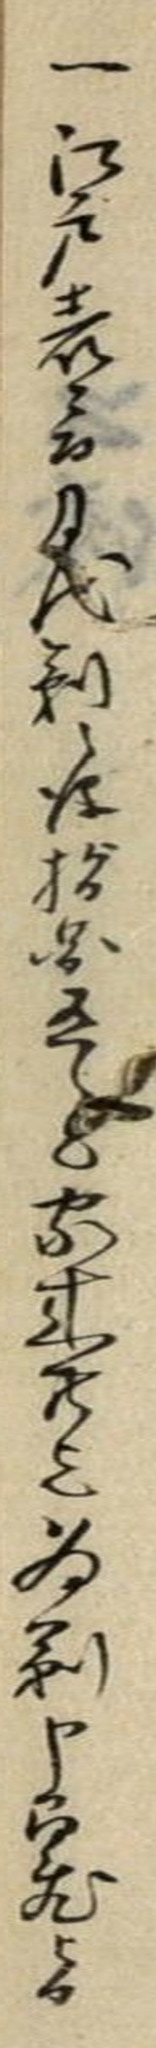一江戸表にて月代剃之儀指図有之迄家来共迄為剃間敷旨
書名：御停止異変死失
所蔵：福井県文書館 Fukui Prefectural Archives
